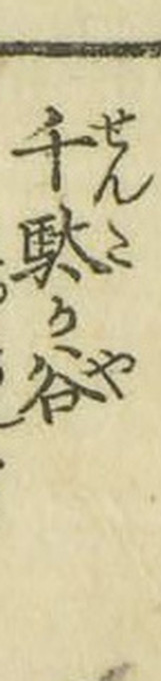千駄か谷
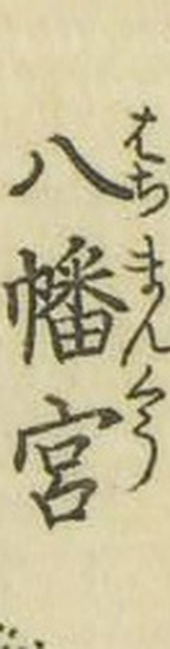八幡宮
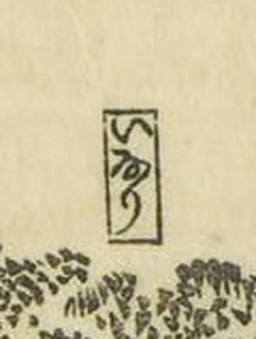いなり
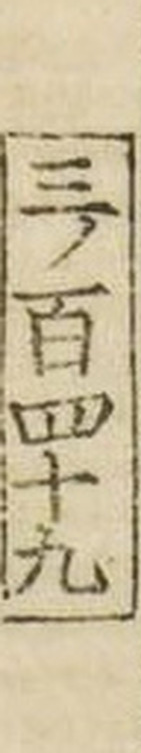三ノ百四十九
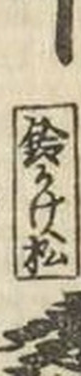鈴かけ松

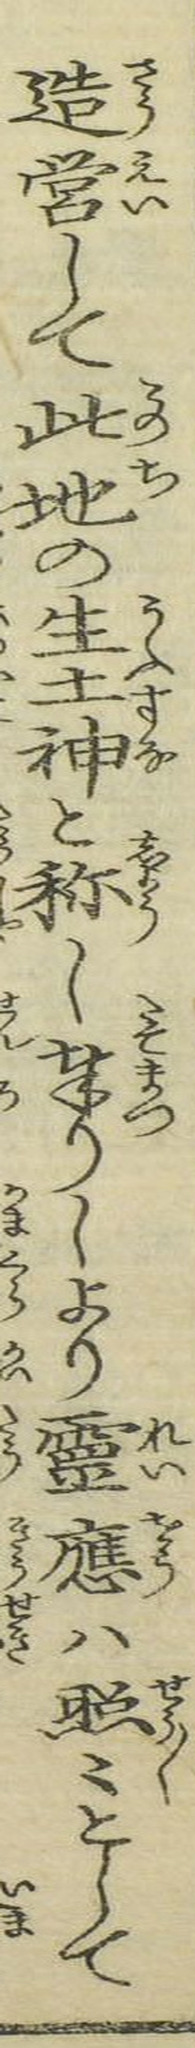造営して此地の生土神と称し奉りしより霊応は照々として
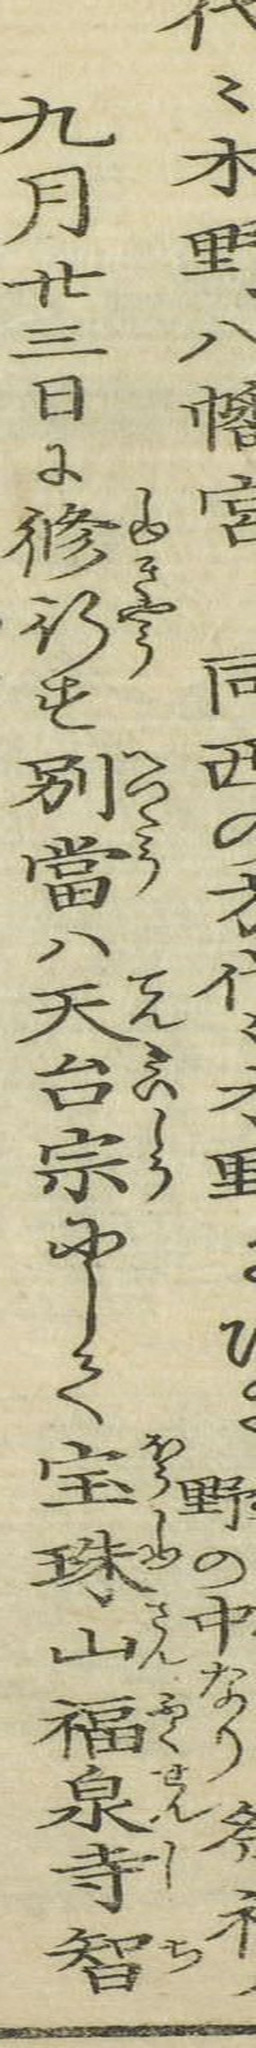九月廿三日に修行す別当は天台宗にして宝珠山福泉寺智
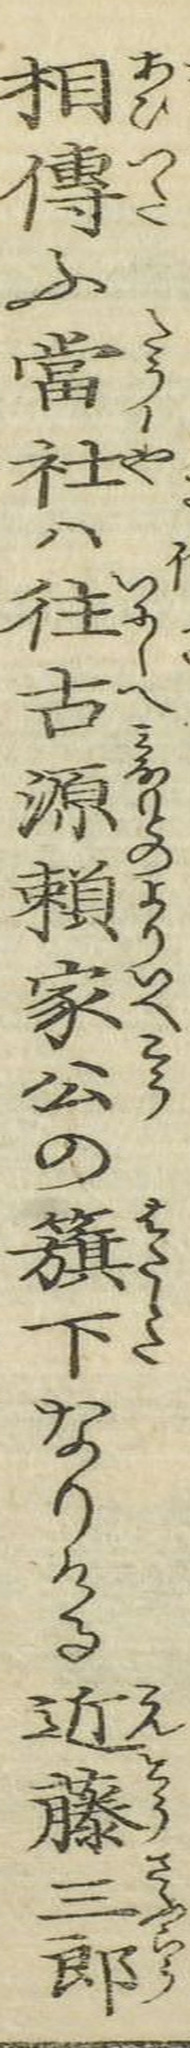相傳ふ当社は往古源頼家公の籏下なりける近藤三郎
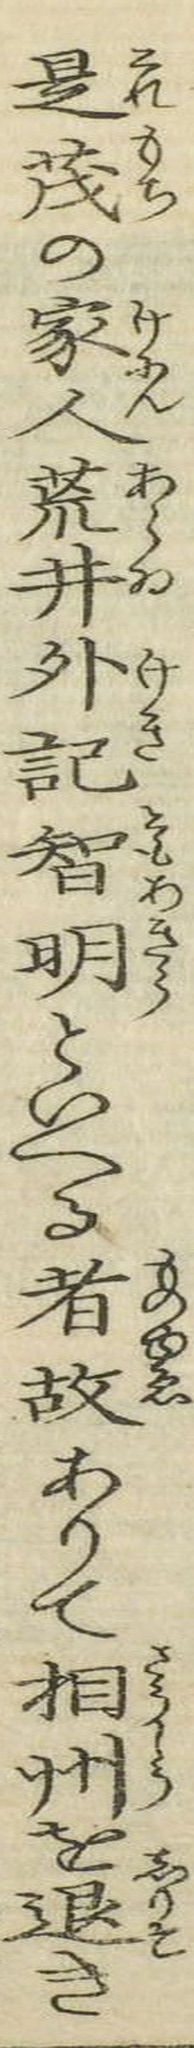是茂の家人荒井外記智明といへる者故ありて相州を退き
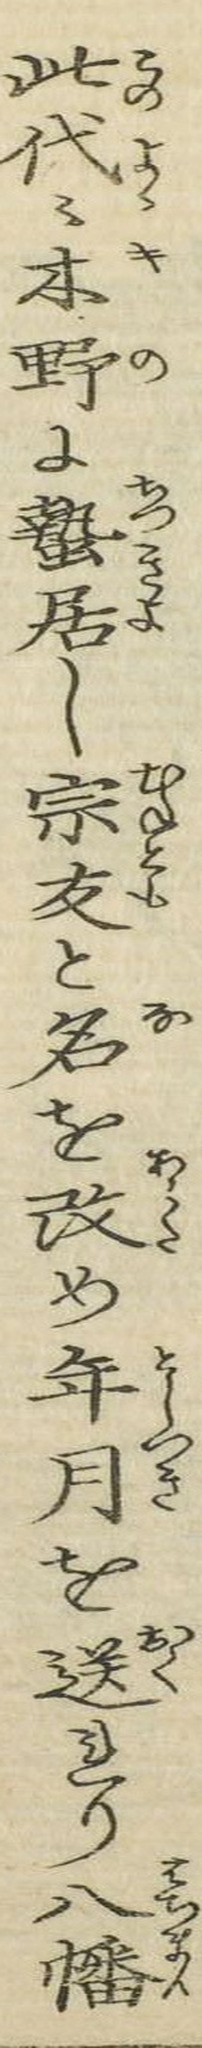此代々木野に蟄居し宗友と名を改め年月を送れり八幡
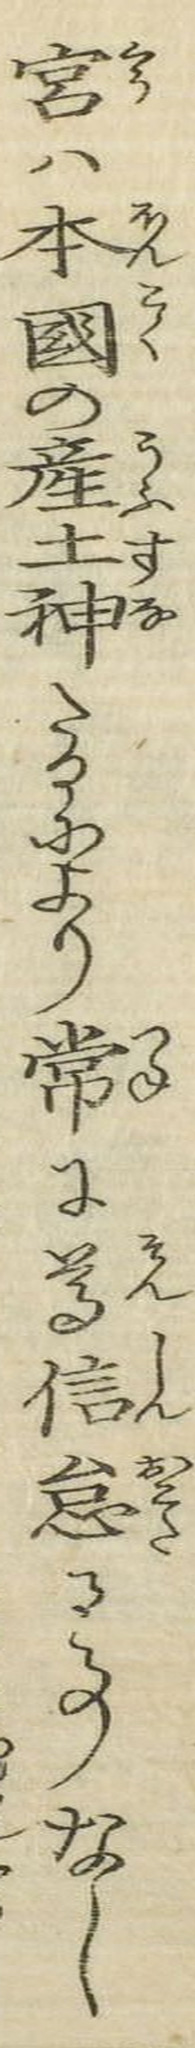宮は本国の産土神たるにより常に尊信怠る事なし
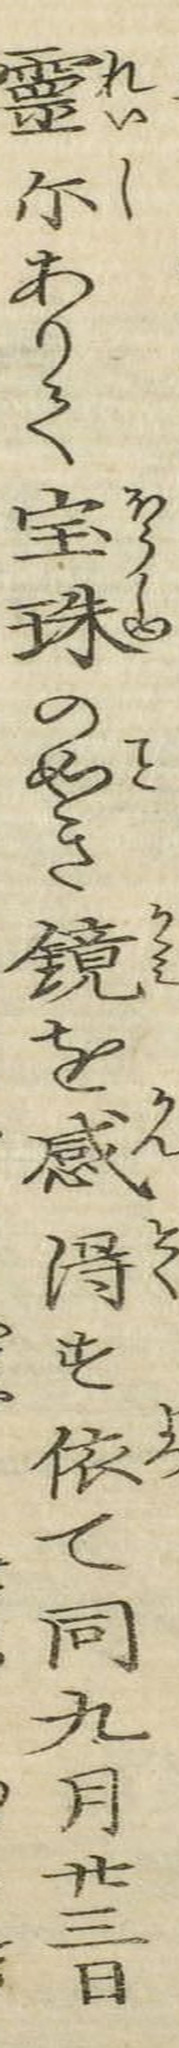霊尓ありて宝珠の如き鏡を感得す依て同九月廿三日
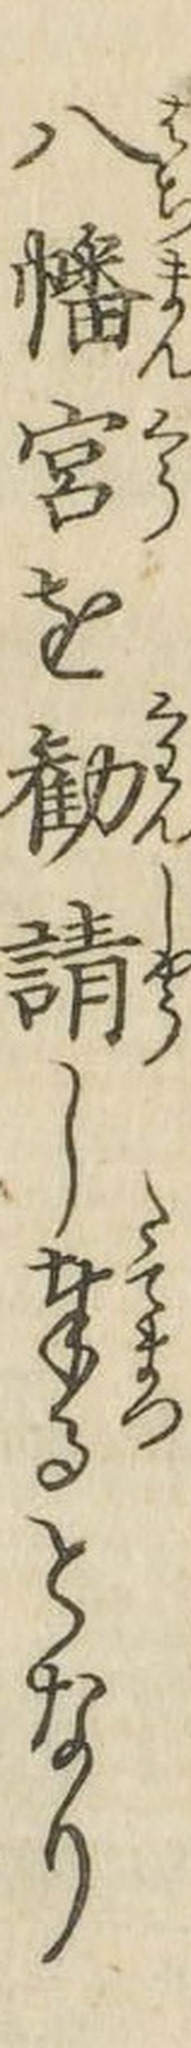八幡宮を勧請し奉るとなり
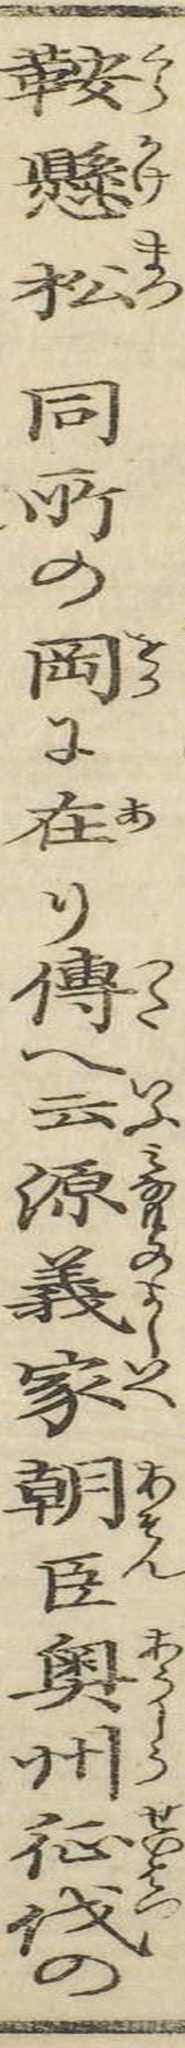鞍懸松同所の岡に在り傳へ云源義家朝臣奥州征伐の
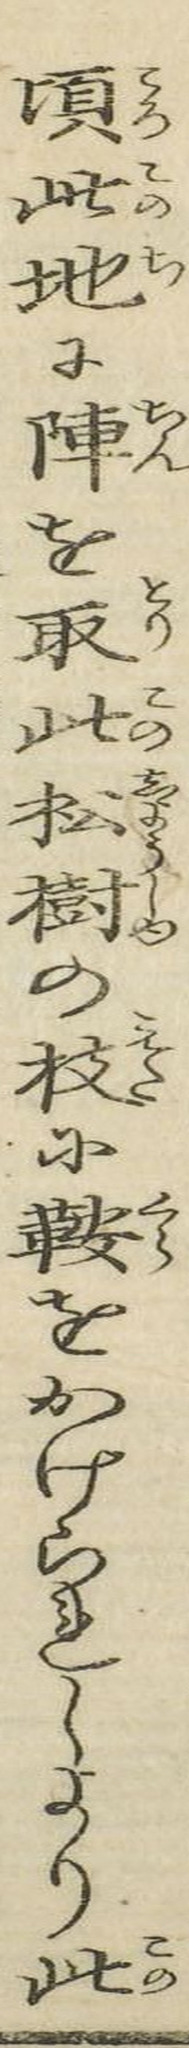頃此地に陣を取此松樹の枝に鞍をかけられしより此
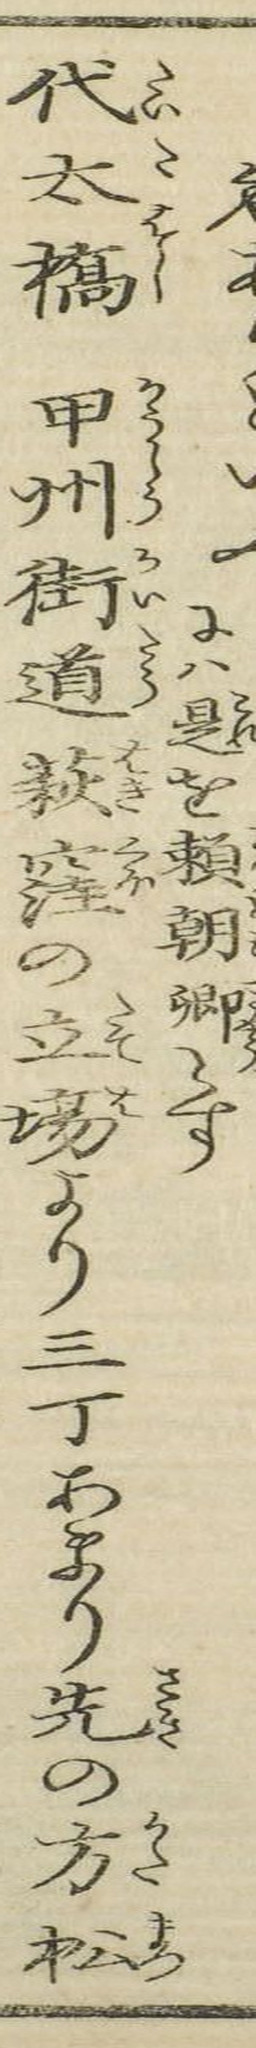代太橋甲州街道萩窪の立場より三丁あまり先の方松
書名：江戸名所図会 20巻 巻之9
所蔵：東京学芸大学教育コンテンツアーカイブ
